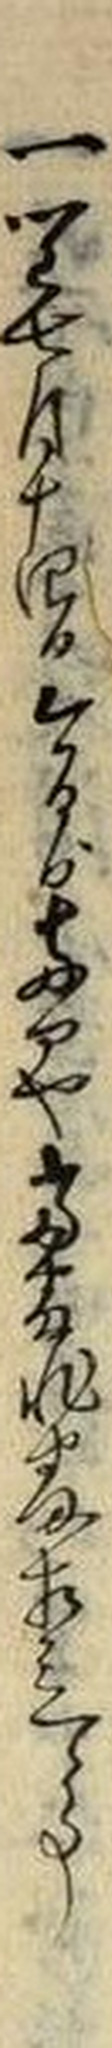一閏七月十四日今日ゟ両部や当番非番相立候事

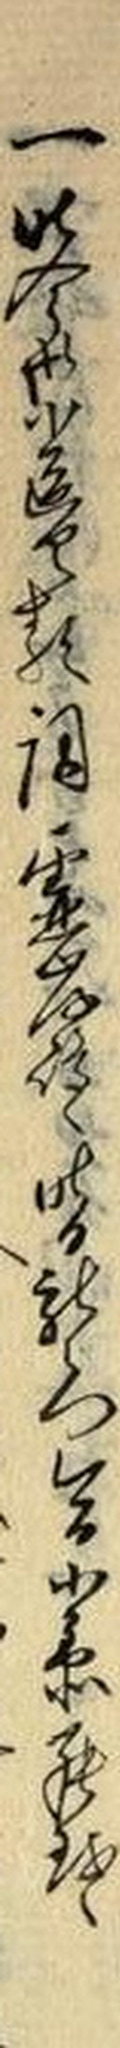一昨今御小道具類調霊岸嶋へ昨日新右衛門今日小兵衛罷越候
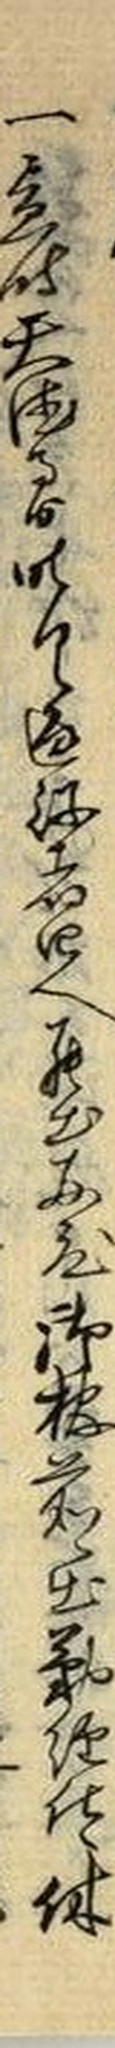一昼時天徳寺ゟ昨日之通役者四人罷出両度御棺前へ出勤経仕候休
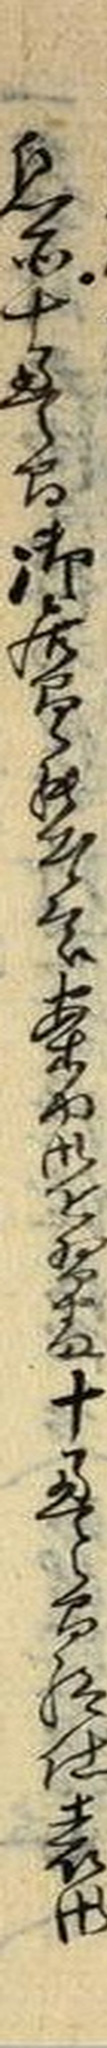息所十畳之間御居間へ罷出候節案内御近習番十畳之間給仕表御
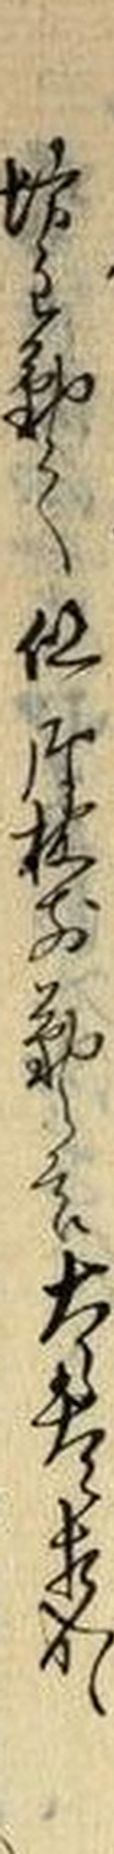坊主勤之但御棺前勤之節大奥へ相成候
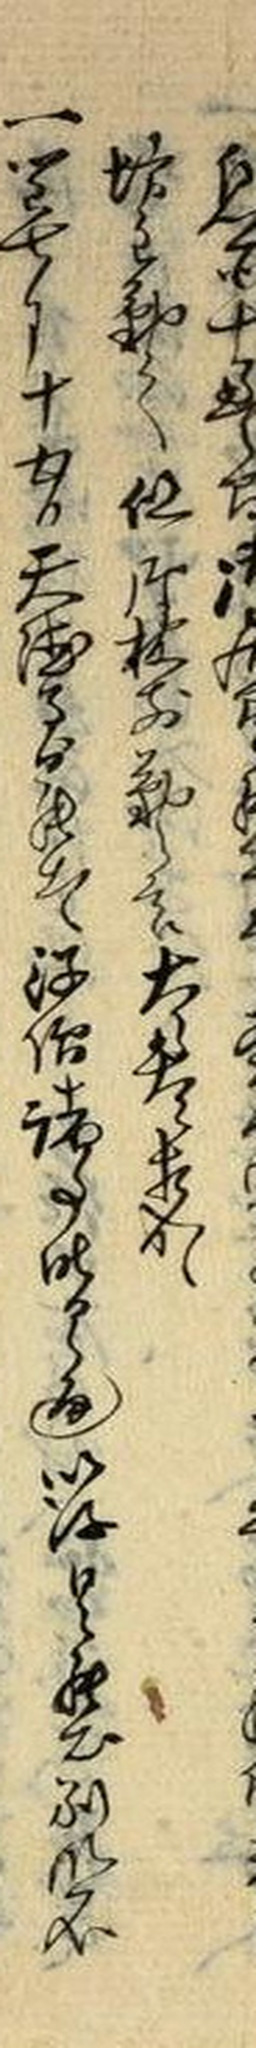一閏七月十五日天徳寺ゟ罷出候役僧諸事昨日之通以後日々罷出別段不
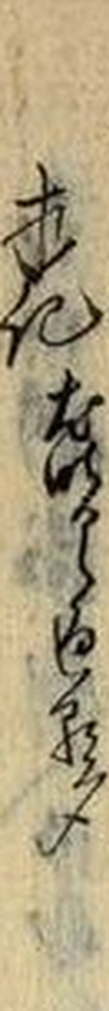相記尤昨日之通朝夕
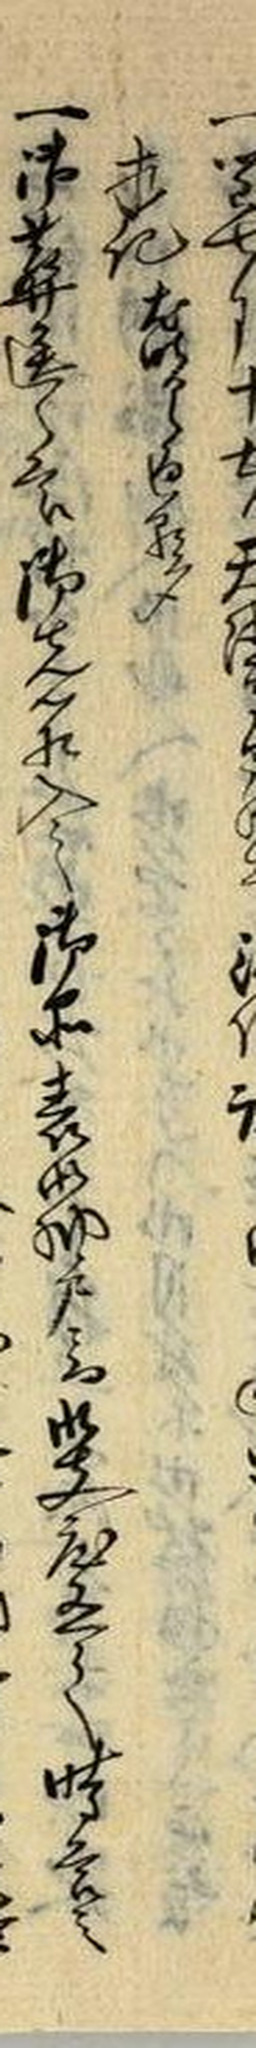一御葬送之節御先箱入之御品表御納戸ニ而御支度有之時節之
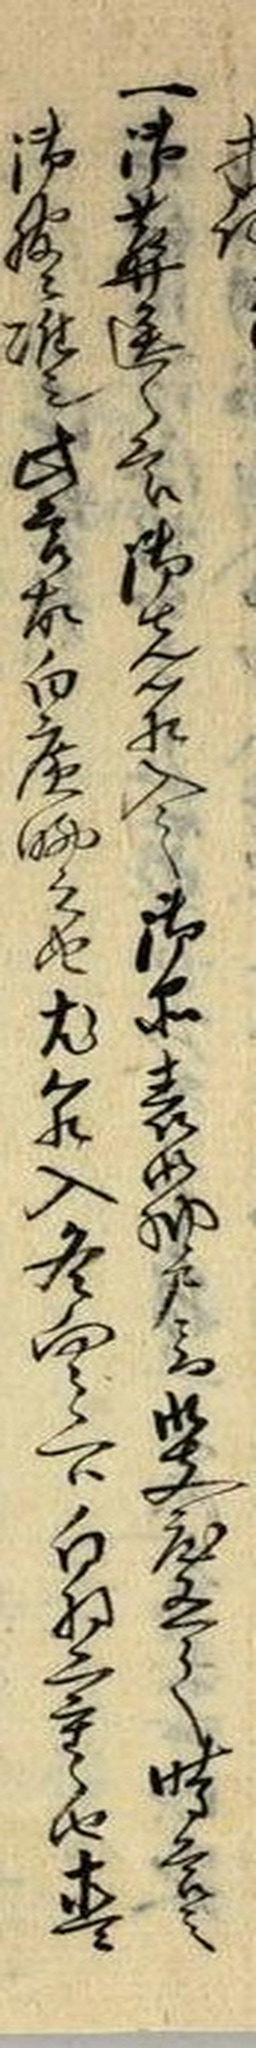御服ニ准シ此節故白広晒之由尤箱入冬向ニ候へハ白羽二重之由直ニ
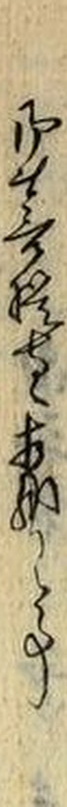御菩提寺へ相納り候事
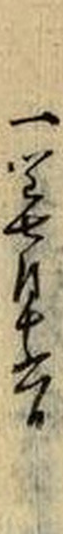一閏七月十六日
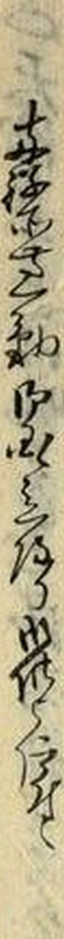両役所兼勤御国へ立帰り御供被仰付候
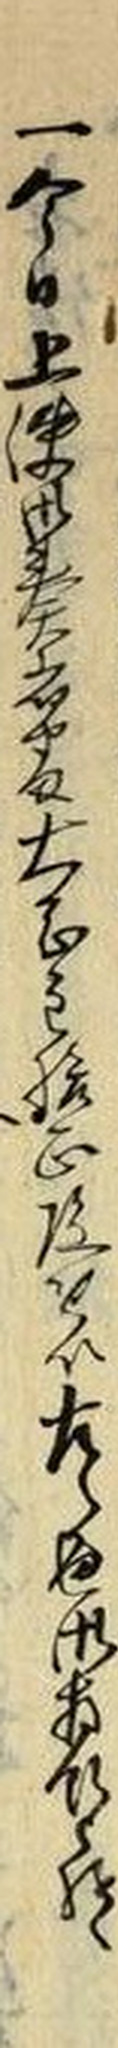一今日上使御奏者番大岡主膳正殿を以左之通御拝領被遊候
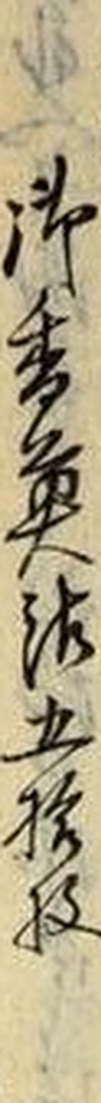御香奠銀五拾枚
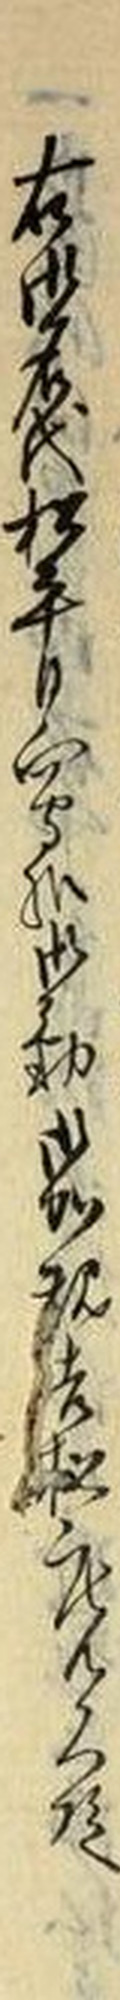右御名代松平日向守様御勤御加規吉松庄右衛門殿
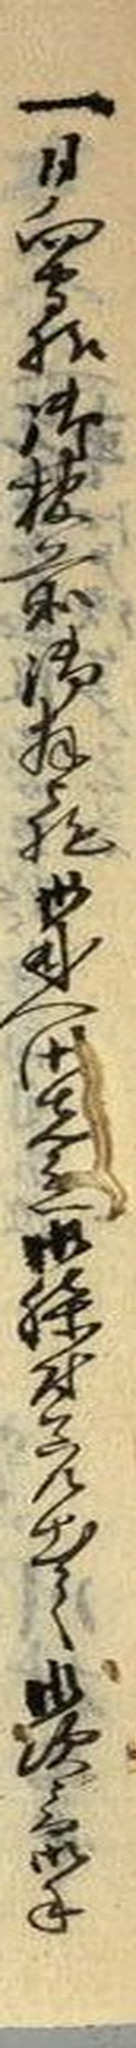一日向守様御棺前御拝被遊御用人御先立御膝付差出之御次ニ而御手
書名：少傅日録抄（斉承付側向頭取日記、在府）
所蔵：福井県文書館 Fukui Prefectural Archives
